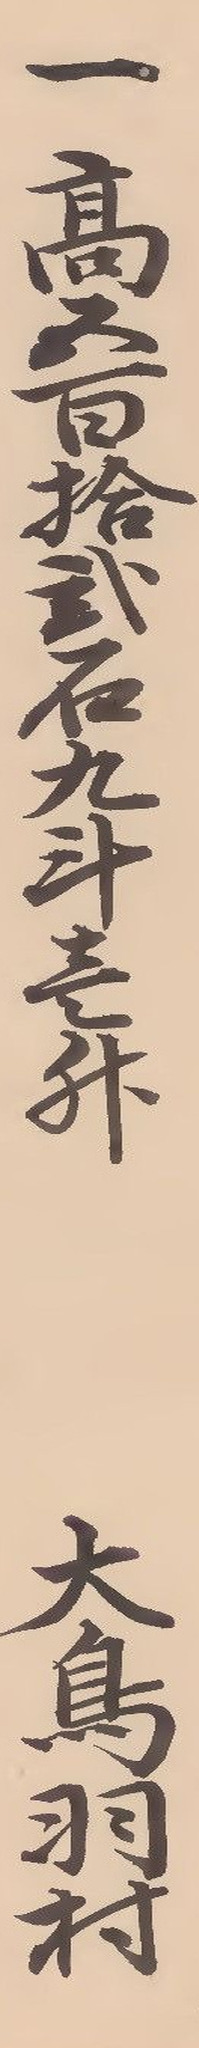一高五百拾弐石九斗壱升大鳥羽村
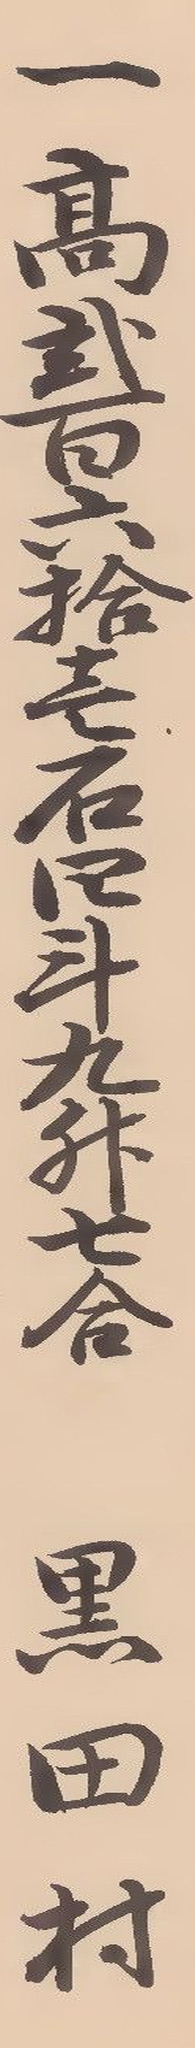一高弐百六拾壱石四斗九升七合黒田村
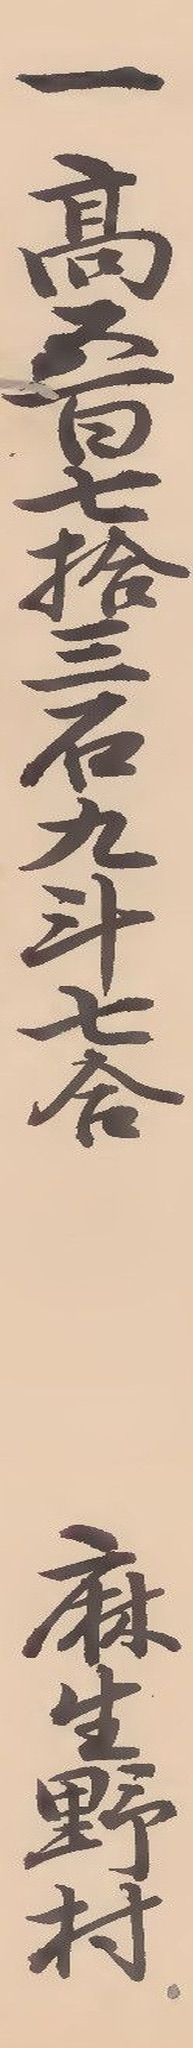一高五百七拾三石九斗七合麻生野村

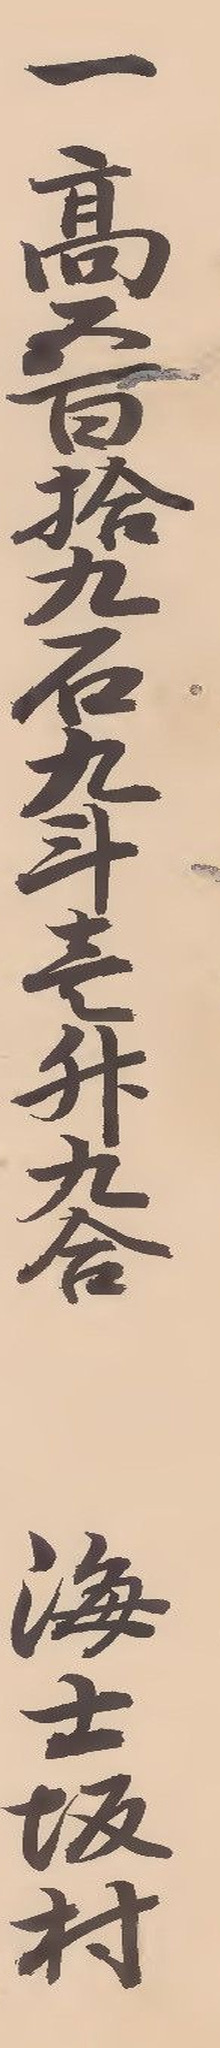一高五百拾九石九斗壱升九合海士坂村
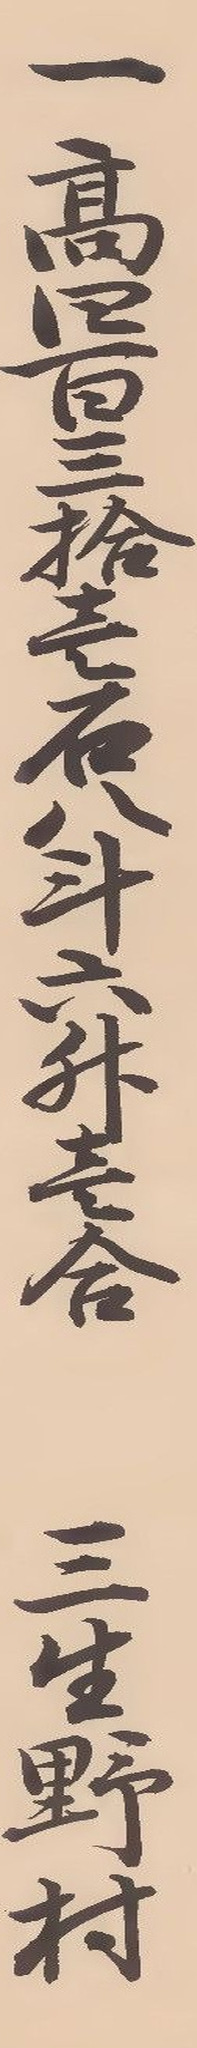一高四百三拾壱石八斗六升壱合三生野村
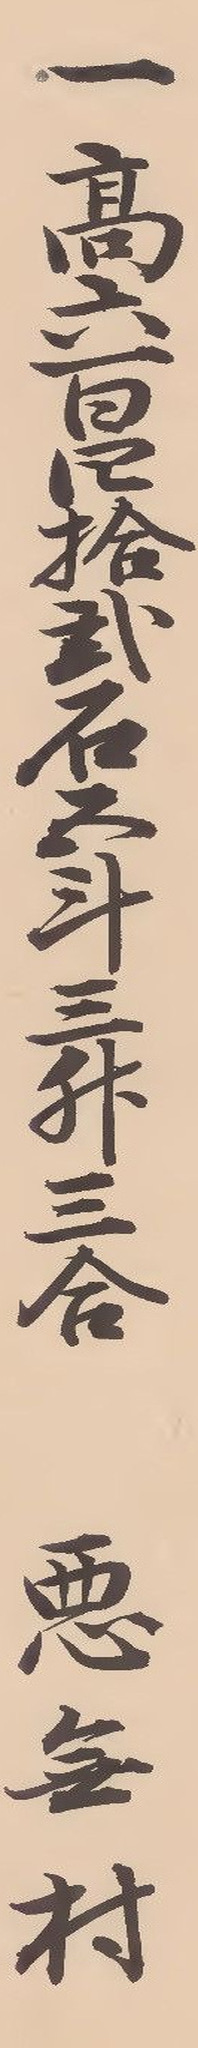一高六百四拾弐石五斗三升三合悪無村
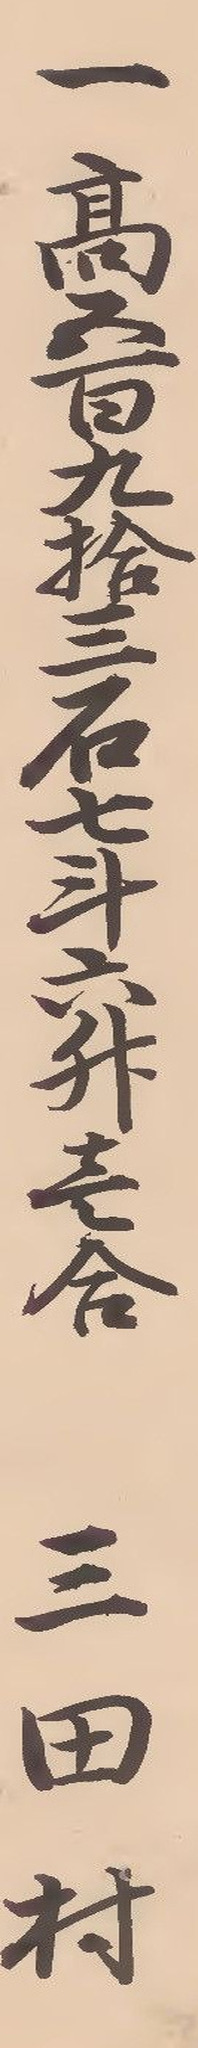一高五百九拾三石七斗六升壱合三田村
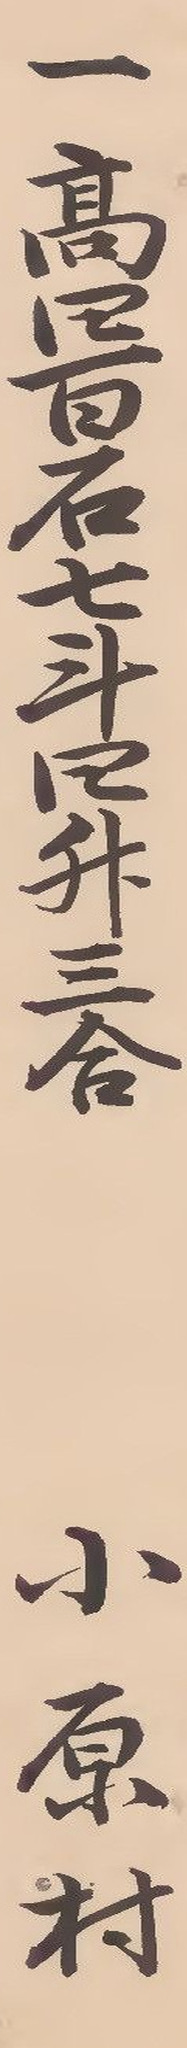一高四百石七斗四升三合小原村
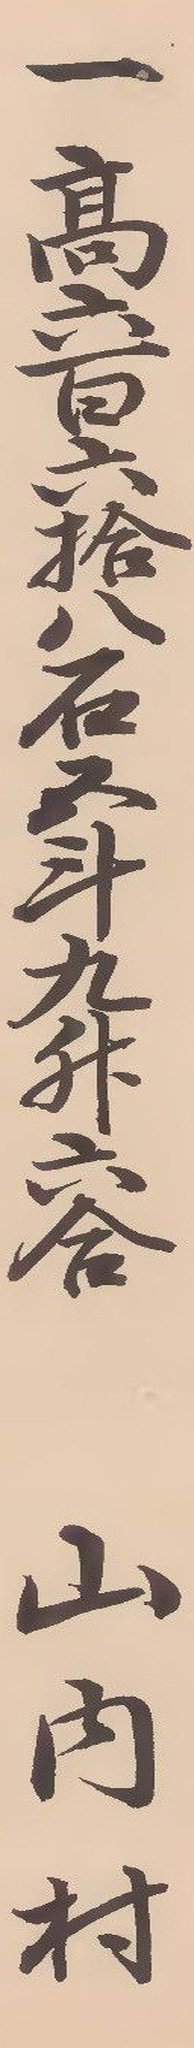一高六百六拾八石五斗九升六合山内村
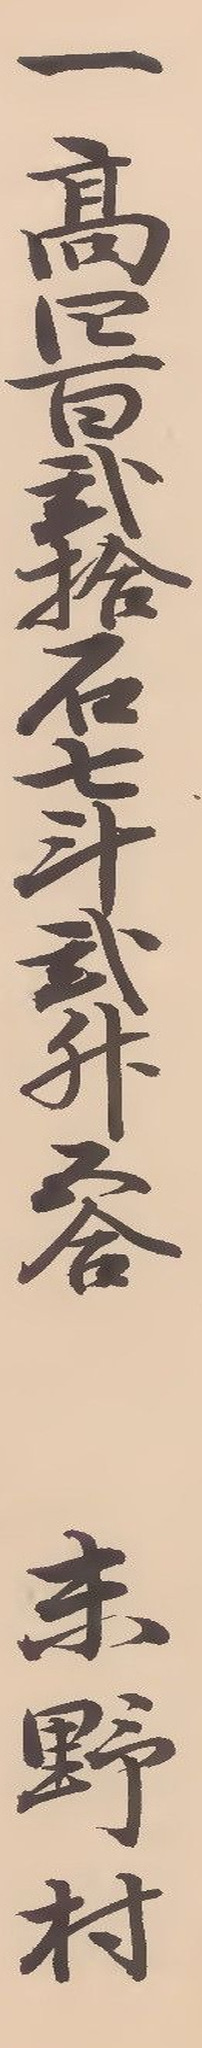一高四百弐拾石七斗弐升五合末野村

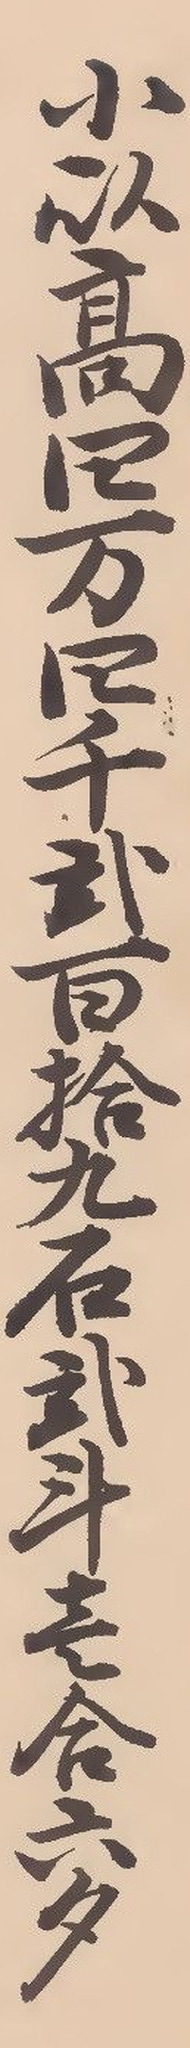小以高四万四千弐百拾九石弐斗壱合六勺
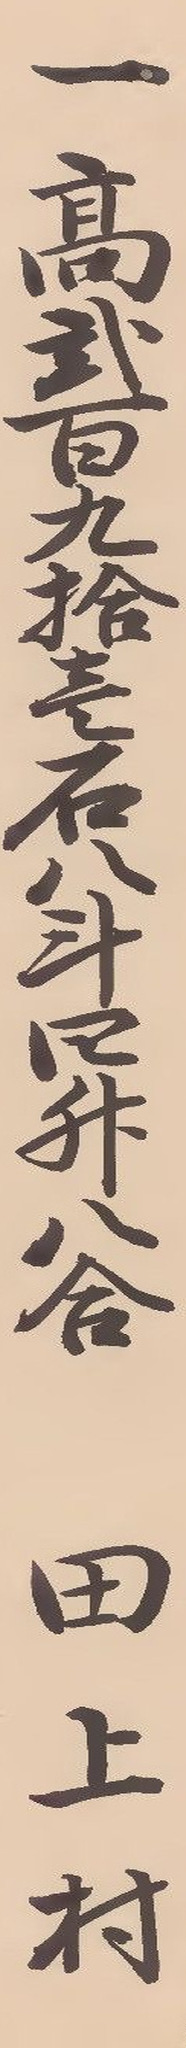一高弐百九拾壱石八斗四升八合田上村
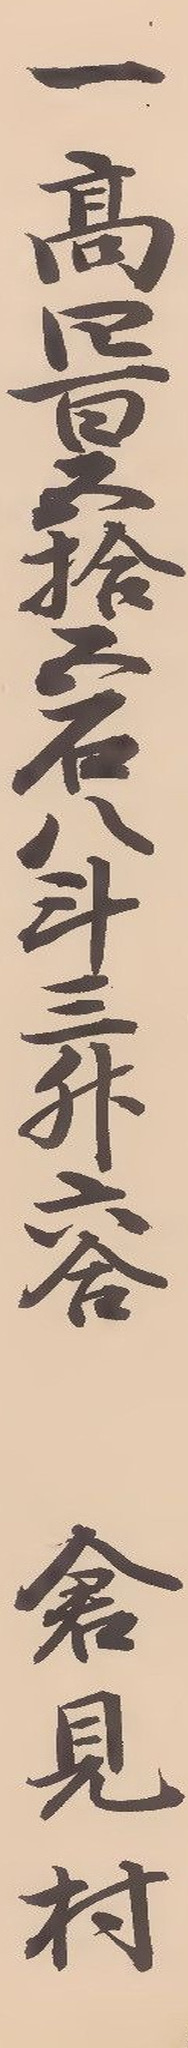一高四百五拾五石八斗三升六合倉見村
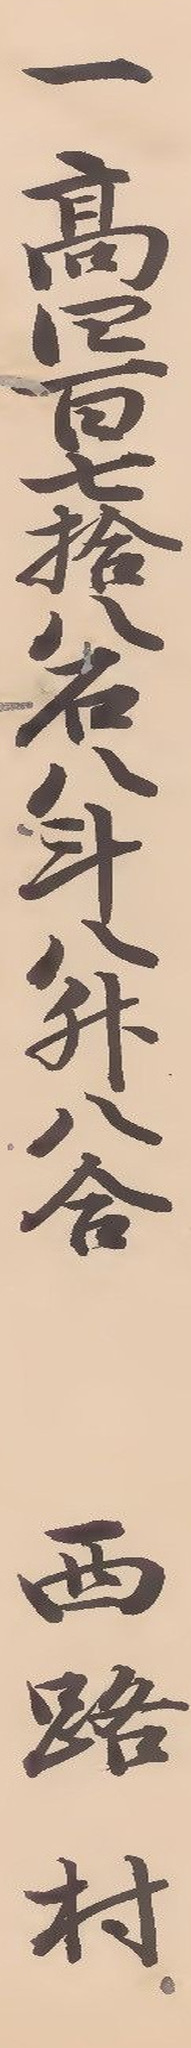一高四百七拾八石八斗八升八合西路村

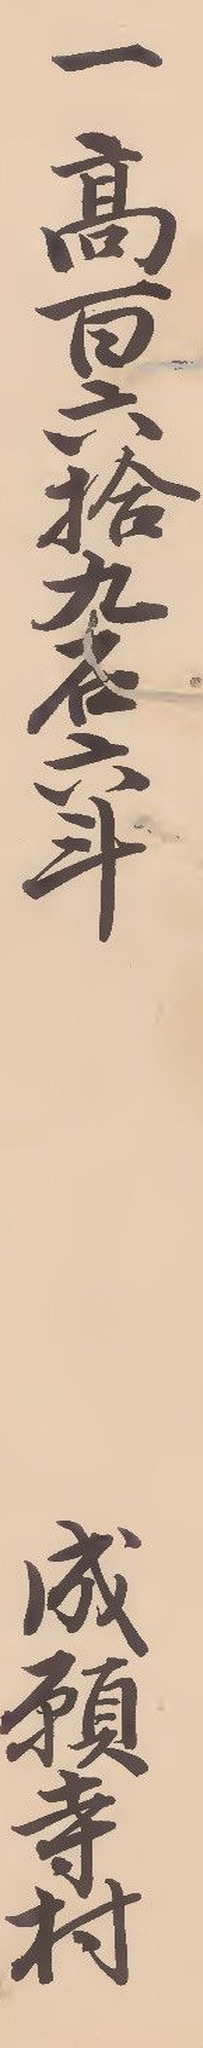一高百六拾九石六斗成願寺村
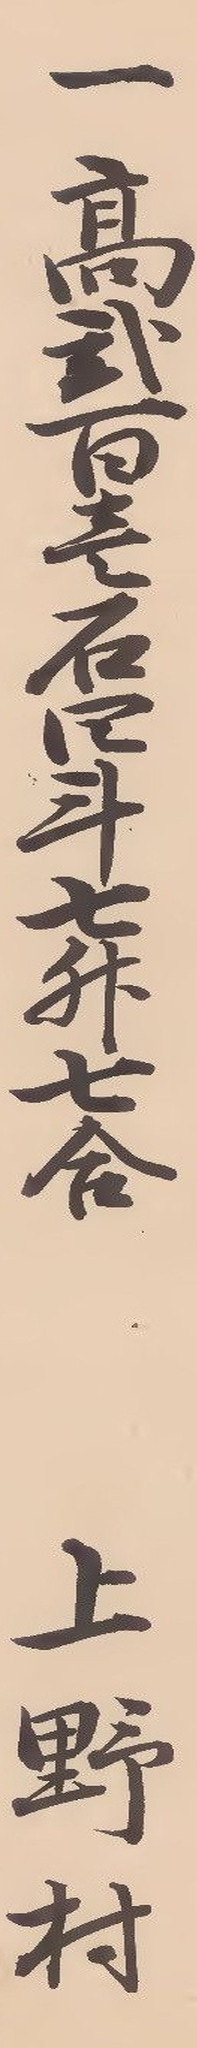一高弐百壱石四斗七升七合上野村
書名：若狭国郷帳
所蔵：国立公文書館 National Archives of Japan
